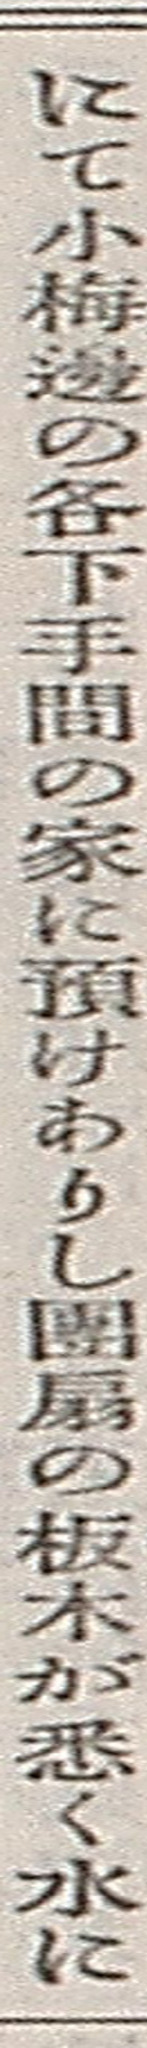にて小梅辺の各下手間の家に預けありし団扇の板木が悉く水に
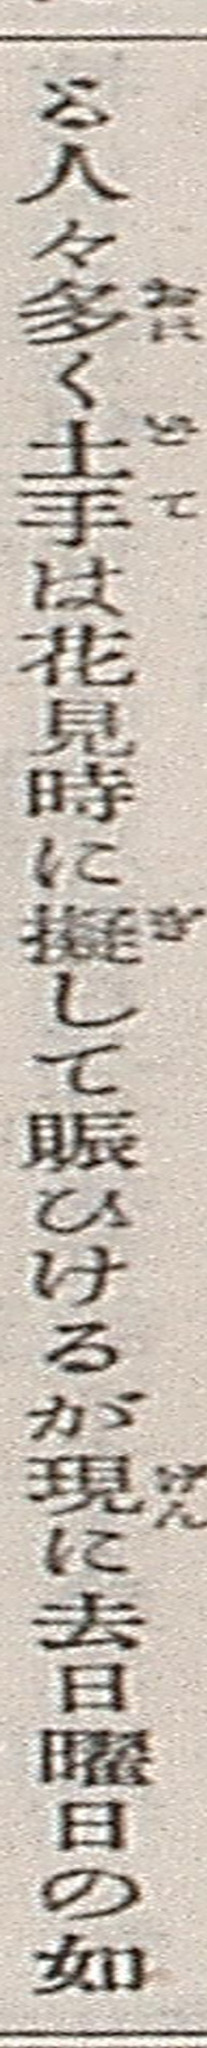る人々多おほく土出は花見時に擬して賑ひけるが現に去日曜日の如
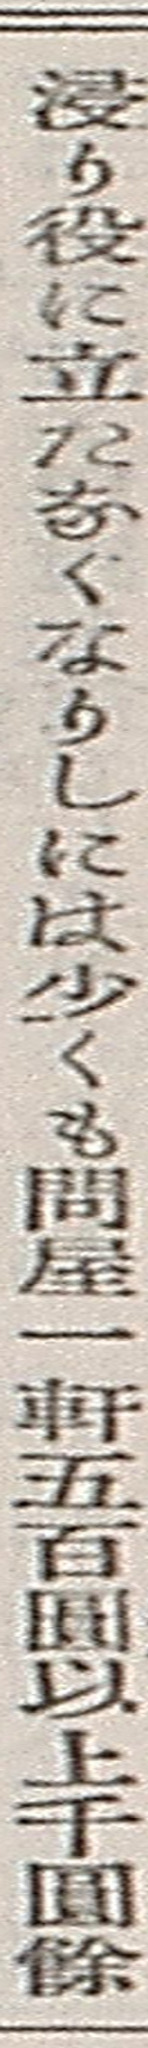浸り役に立たなくなりしには少くも問屋一軒五百円えん以上千円余
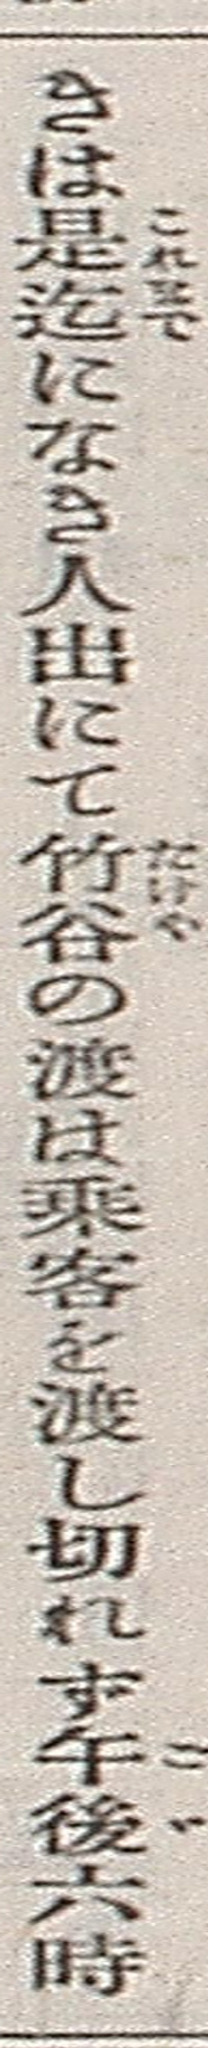きは是迄になき人出にて竹谷の渡は乗客を渡し切れず午後（ごゞ
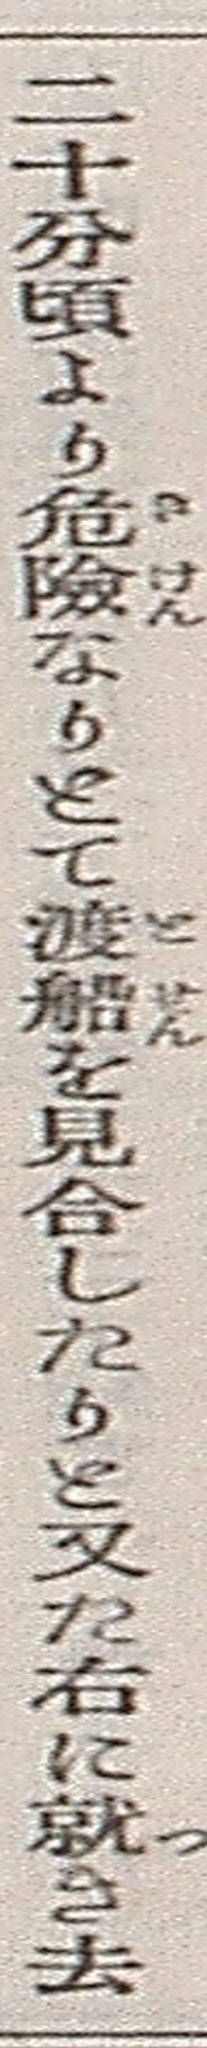二十分頃より危険なりとて渡船を見合したりと又た右に就き去
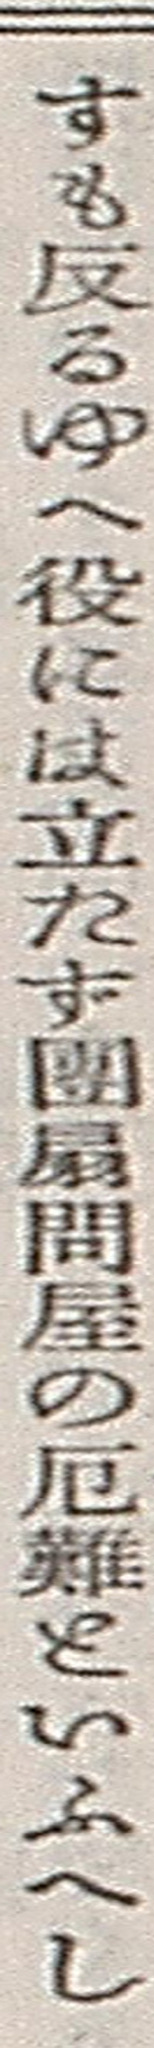すも反るゆへ役には立たず団扇問屋の厄難といふへし
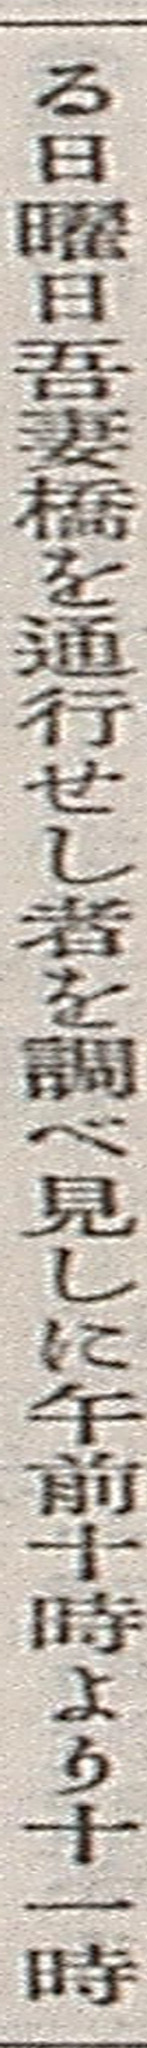る日曜日吾妻橋を通行せし者を調べ見しに午前十時より十一時
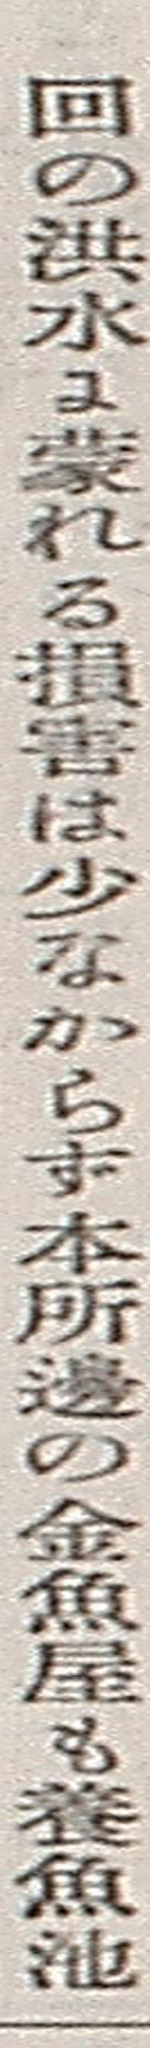回の洪水に蒙れる損害はすくなからず本所辺の金魚やも養魚池
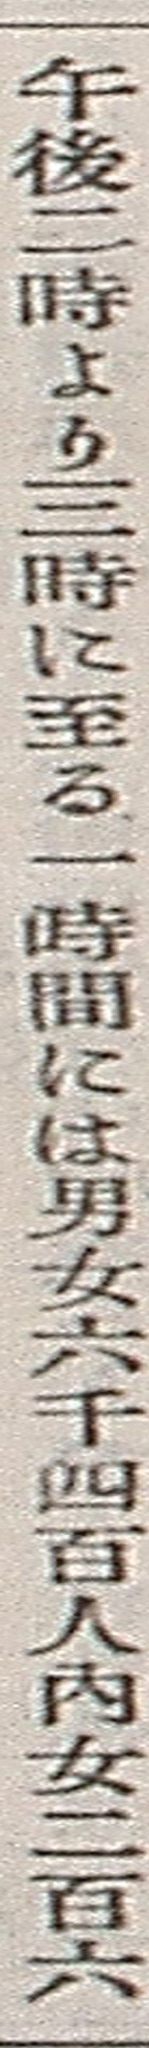午後二時より三時じに至る一時間には男女六千四百人内女二百六
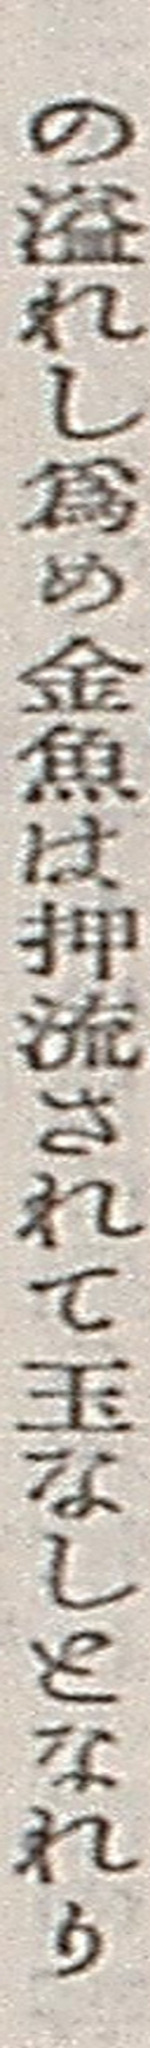の溢れし為め金魚は押流されて玉なしとなれり
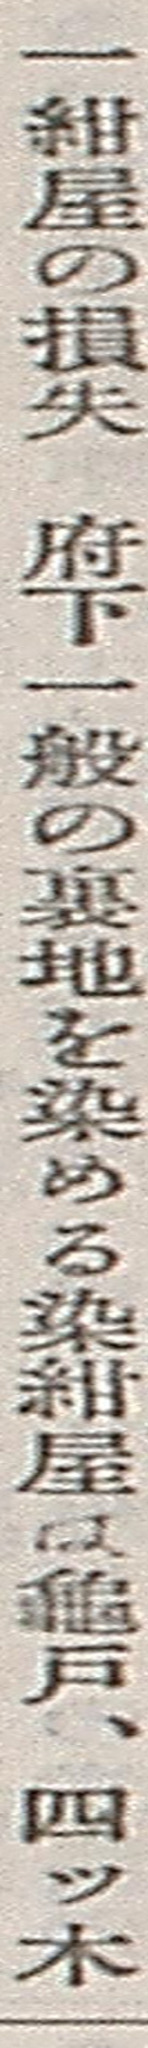一紺屋の損失府下一般はんの裏地を染める染紺屋は亀戸、四ツ木
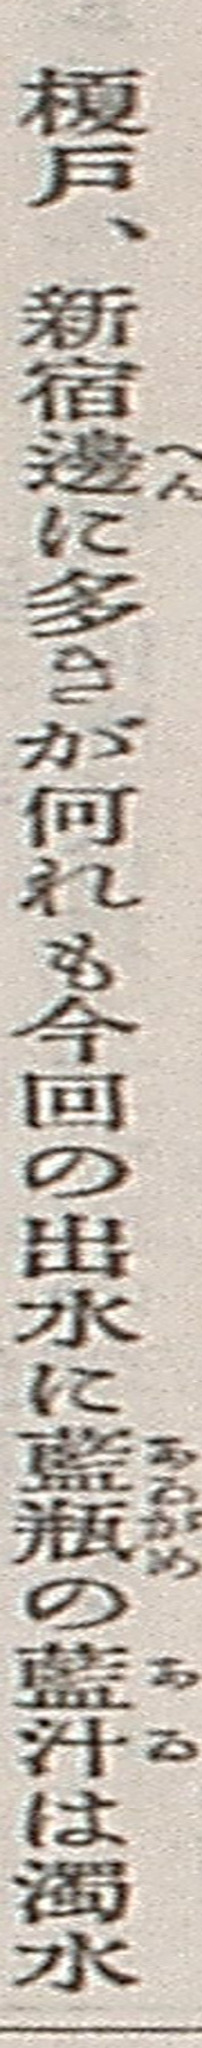榎戸、新宿辺へんに多きが何れも今回の出水に藍瓶の藍汁は濁水
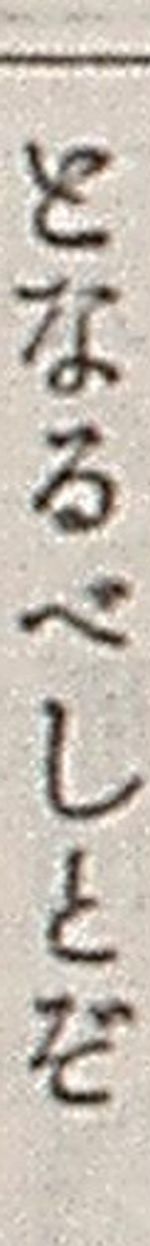となるべしとぞ
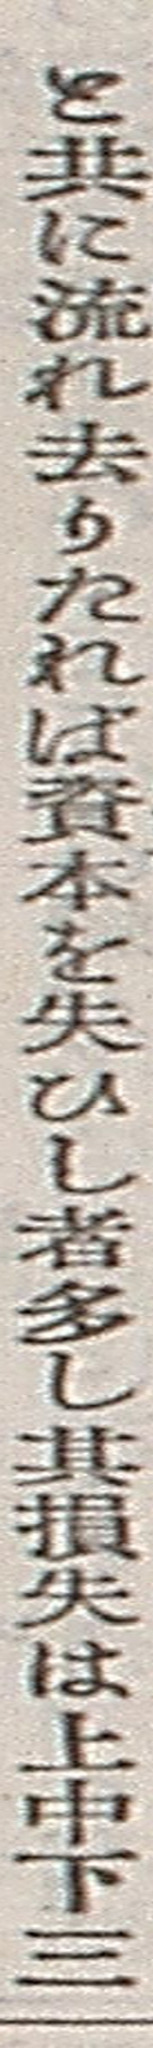と共に流れ去りたれば資本を失ひし者多し其損失は上中下三

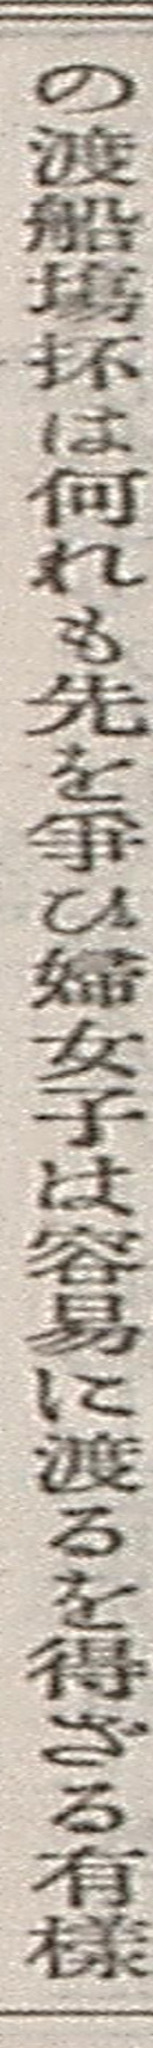の渡船場抔は何れも先を争ひ婦女子は容易に渡るを得ざる有様
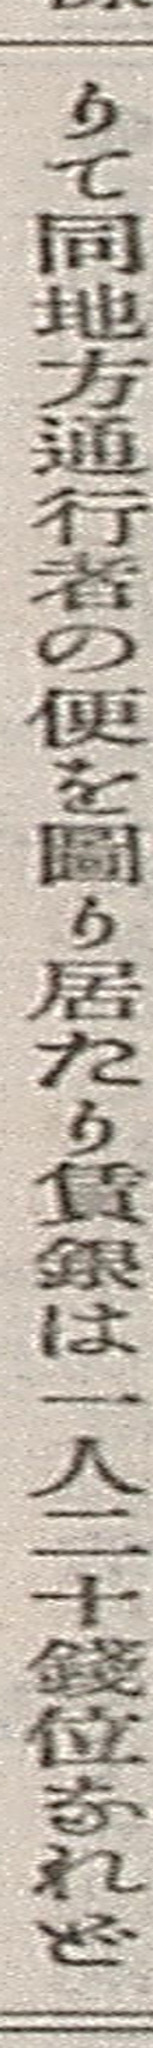りて同地方通行者の便を図り居たり賃銀は一人ニ十銭位なれど
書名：風俗畫報臨時増刊第百二十四號　洪水地震被害録（上）
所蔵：東京大学地震研究所図書室 Earthquake Research Institute Library, The University of Tokyo, JAPAN
